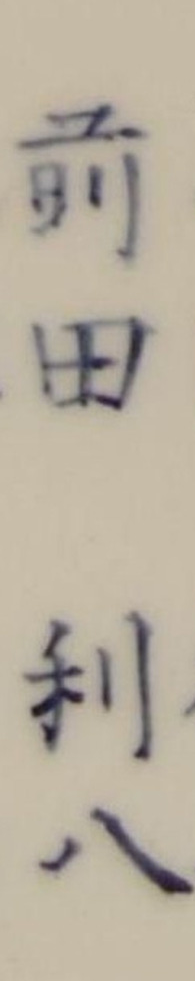前田利八
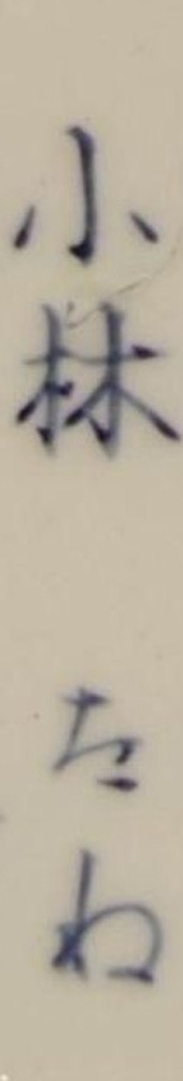小林太ね
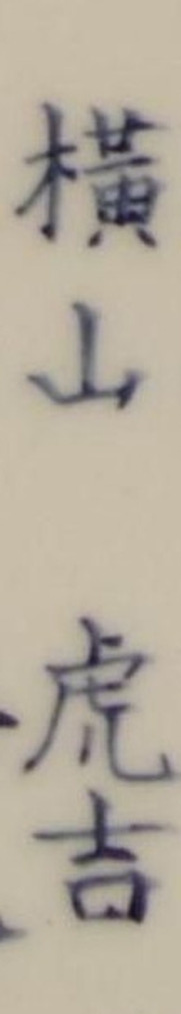横山虎吉
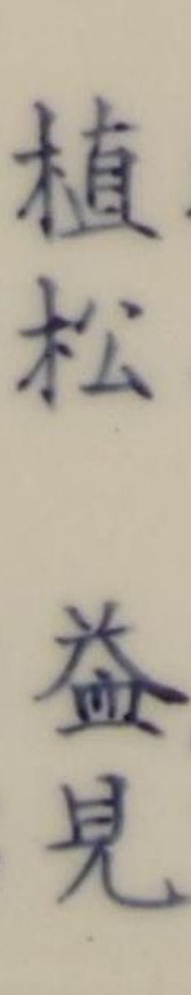植松益見
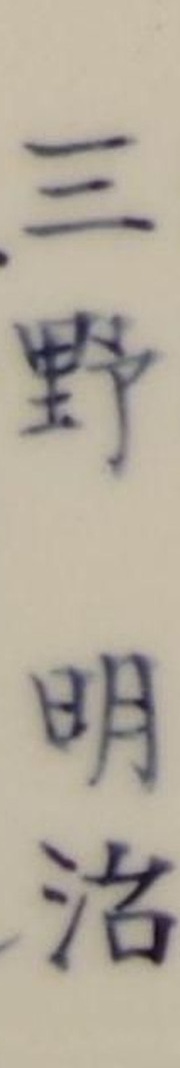三野明治
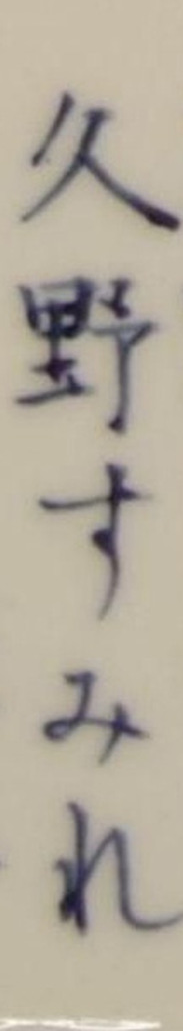久野すみれ

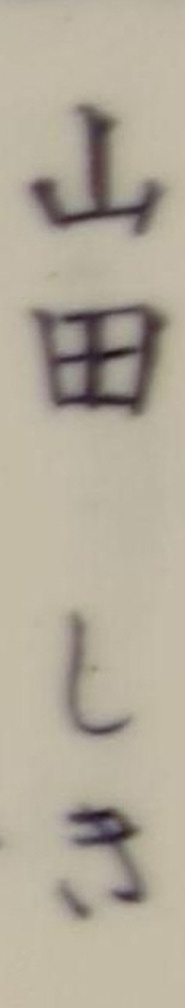山田しき
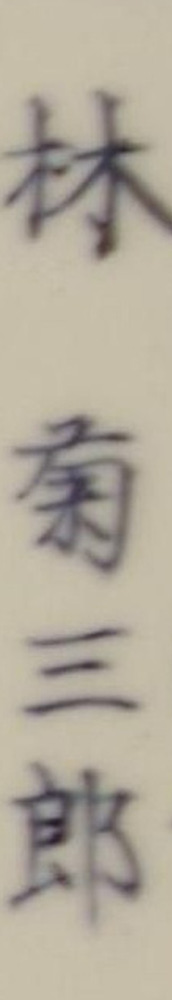林菊三郎
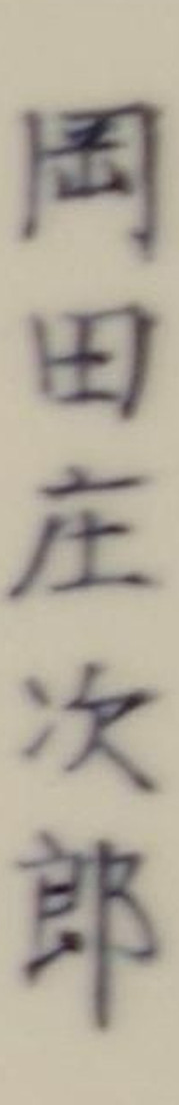岡田庄次郎
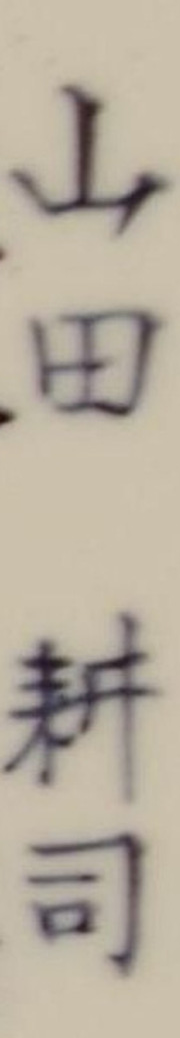山田耕司
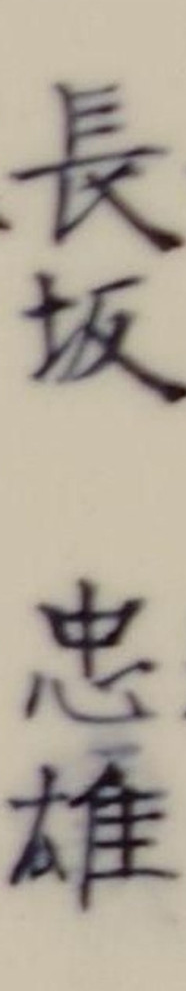長坂忠雄
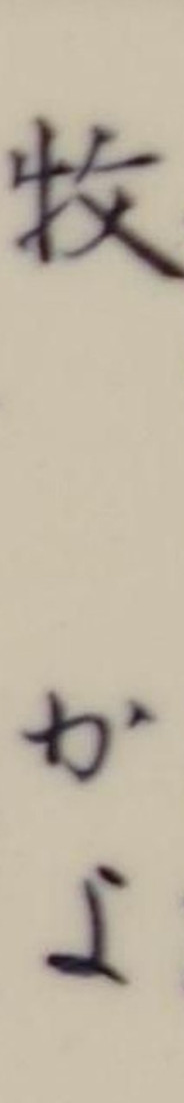牧かよ
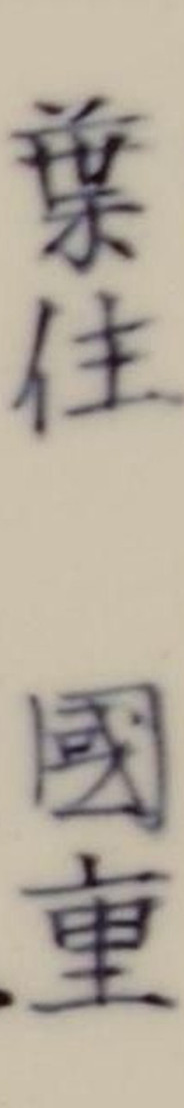葉住国重
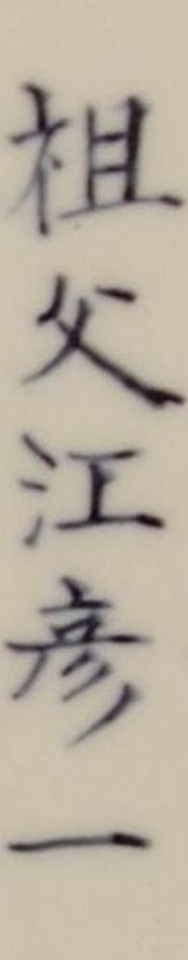祖父江彦一
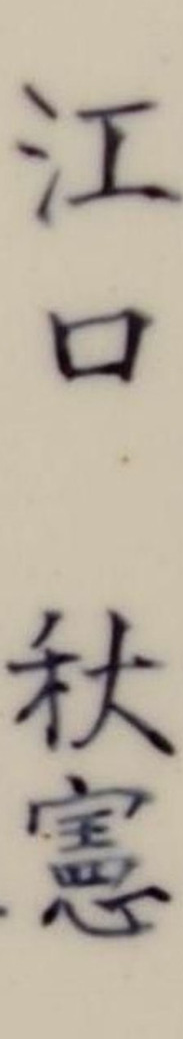江口秋憲
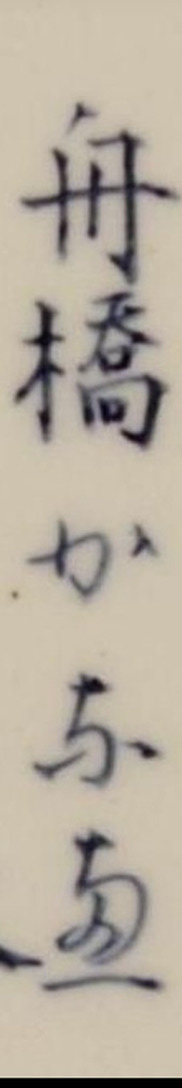舟橋かな恵
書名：E~L
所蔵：高野山金剛峯寺
